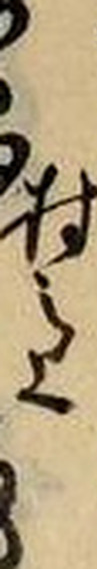村之上

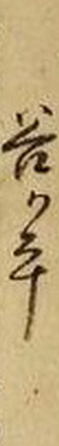谷か平
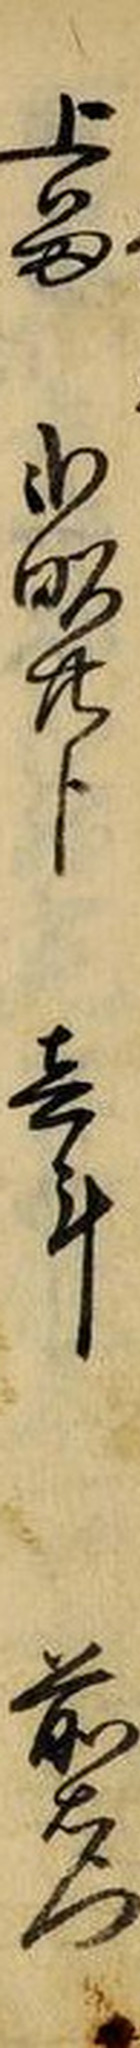上畠弐畝廿歩壱斗前右衛門
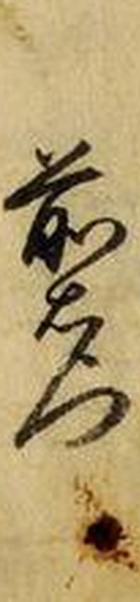久右衛門
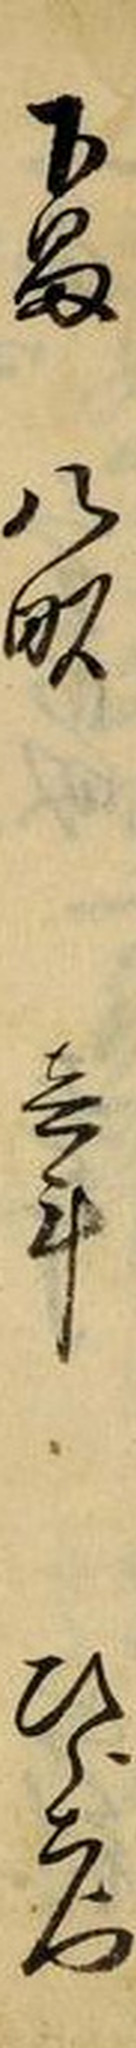下畠八畝壱斗次郎右衛門
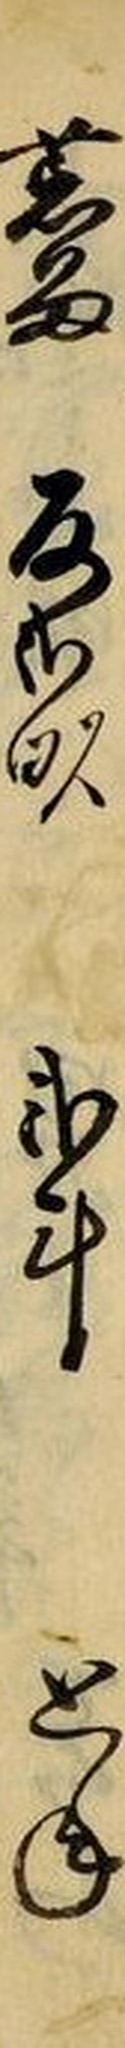荒畠反弐畝弐斗とね
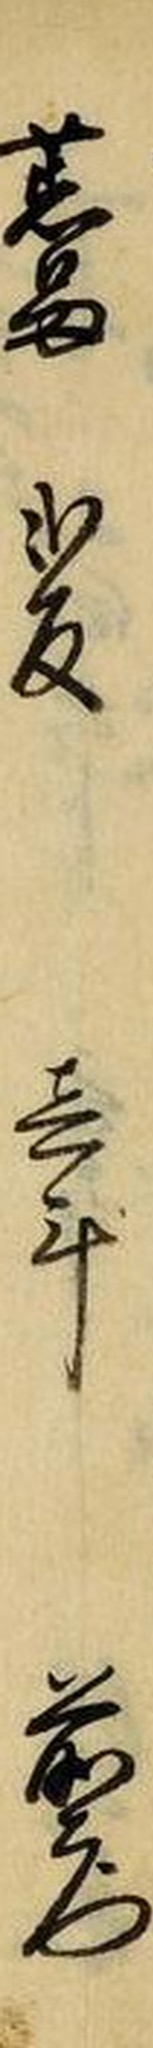荒畠弐反壱斗前右衛門
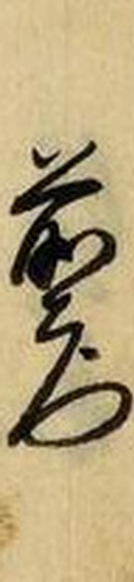久右衛門
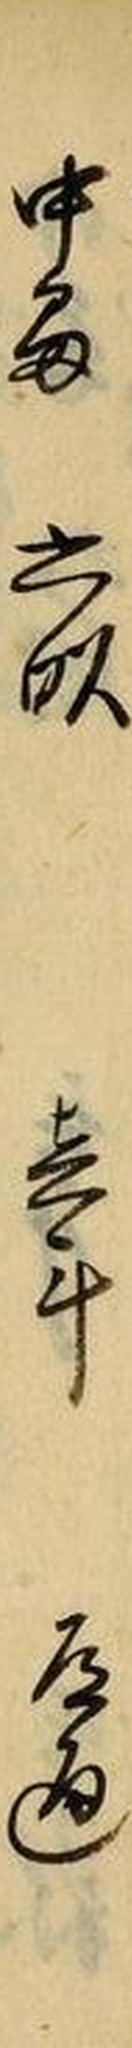中畠六畝壱斗道通
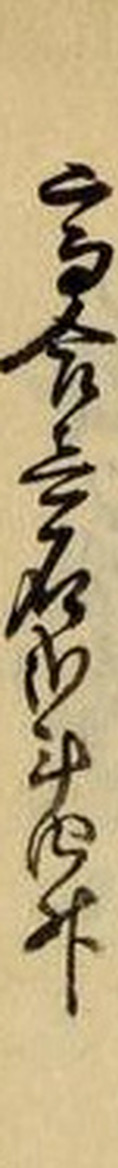高合壱石弐斗四升
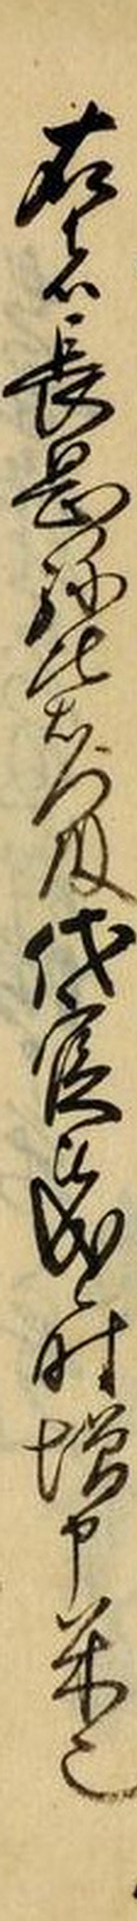右者長岡弥次右衛門殿代官被成候時増申米也
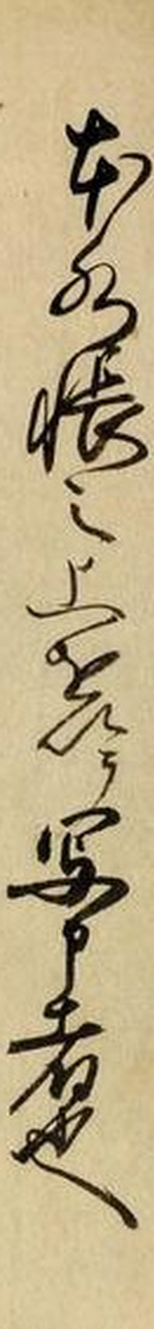本水帳之上を以テ写申者也
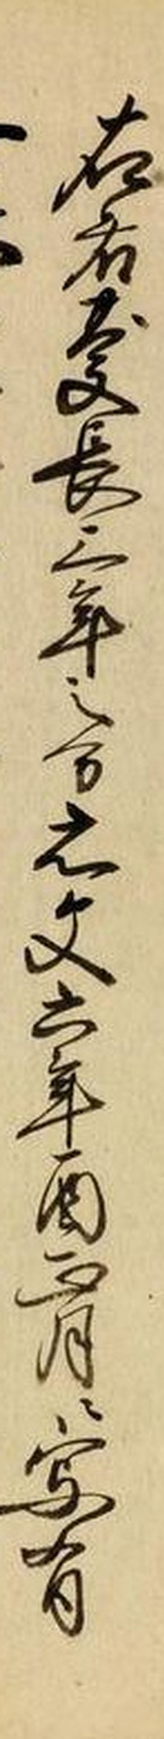右者慶長三年之分元文六年酉正月ニ写有
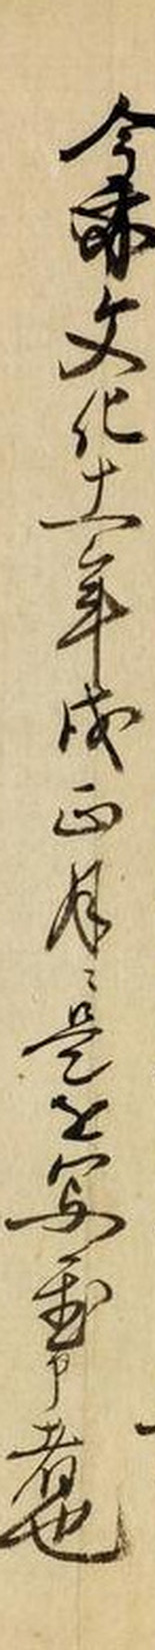今亦文化十一年戌正月ニ是を写置申者也
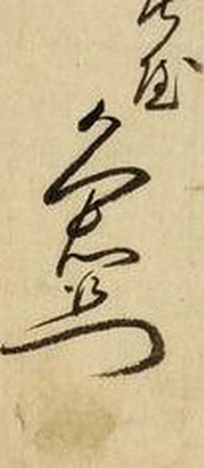久右衛門
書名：慶長三年七月越前国丹生郡玉川浦御検地帳写
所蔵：福井県文書館 Fukui Prefectural Archives
